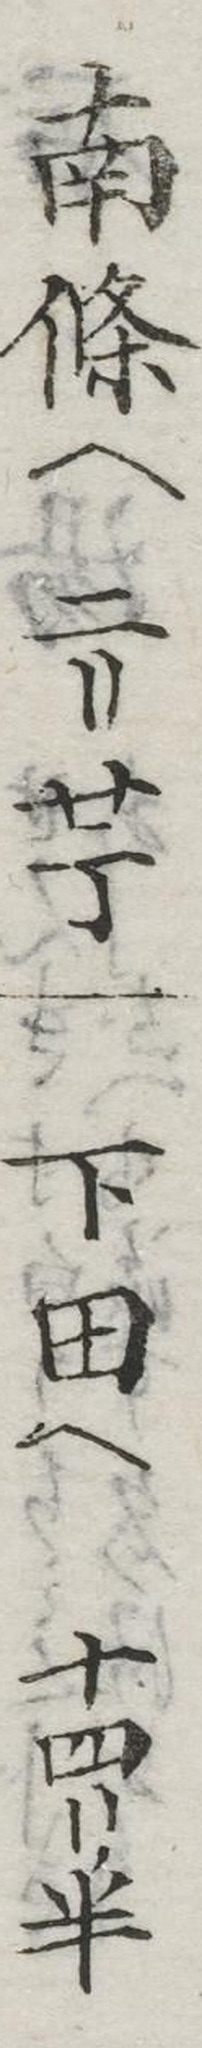南條へ二リ廿丁下田へ十四リ半
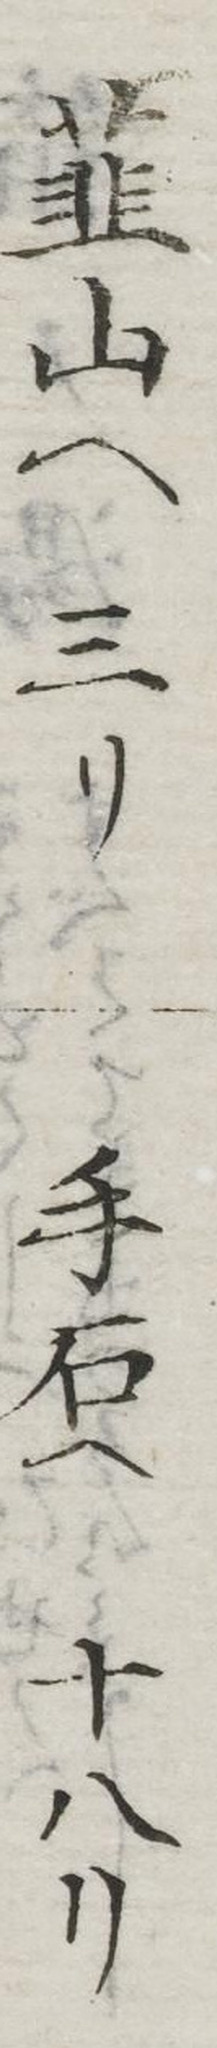韮山へ三リ手石へ十八リ
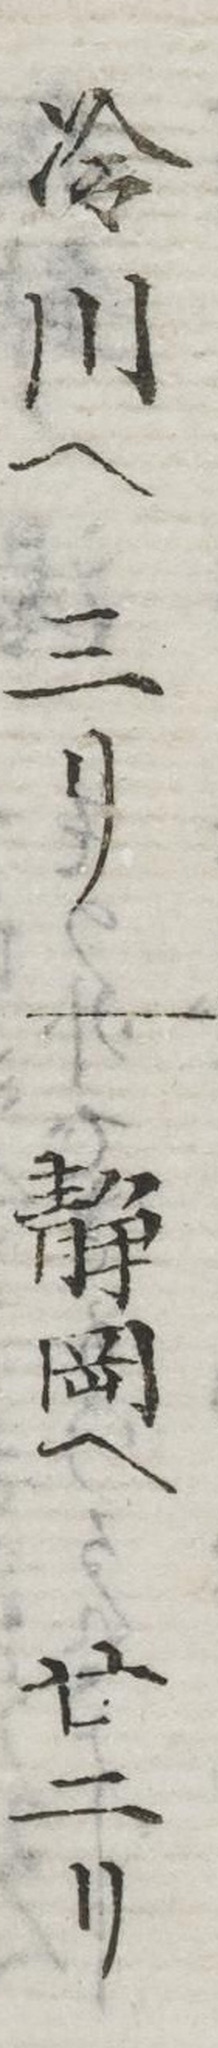冷川へ三リ静岡へ廿二リ

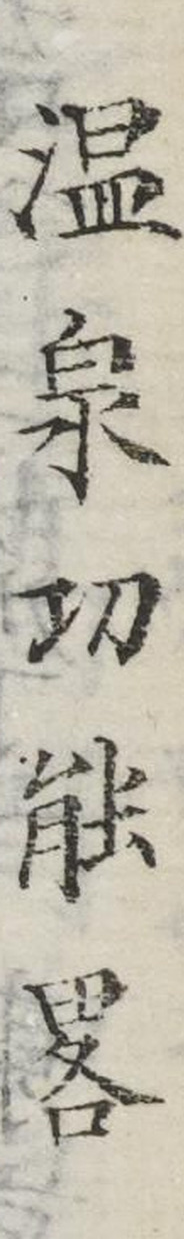温泉功能畧
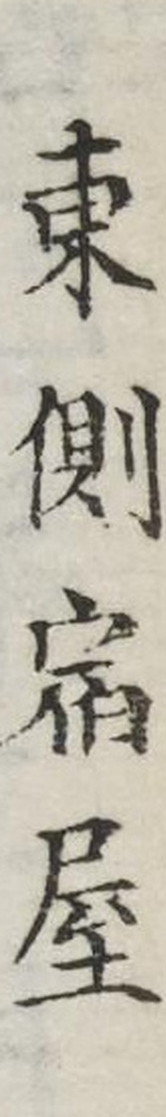東側宿屋
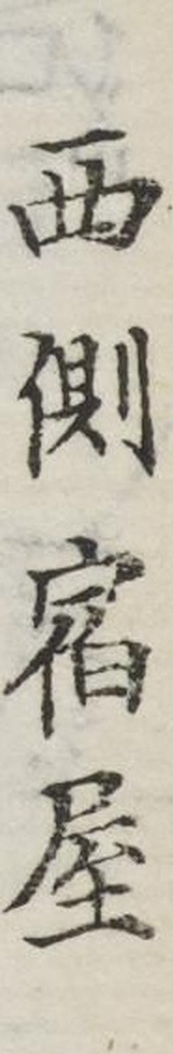西側宿屋
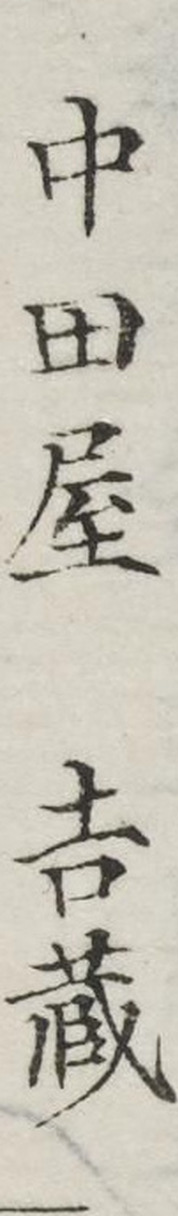中田屋吉蔵
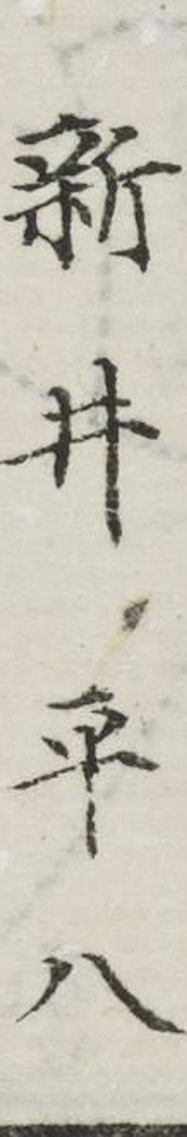新井平八
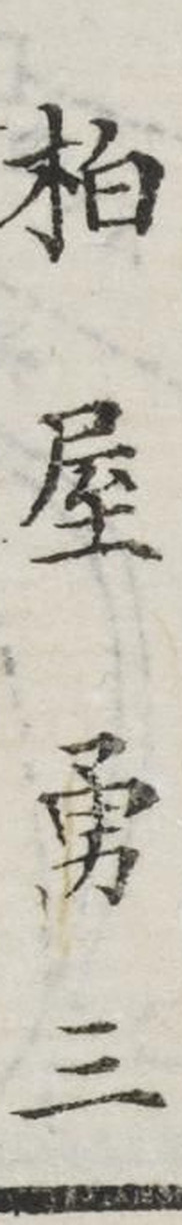柏屋勇三
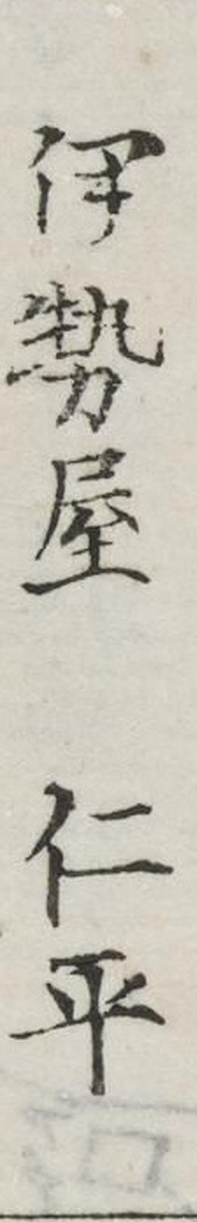伊勢屋仁平
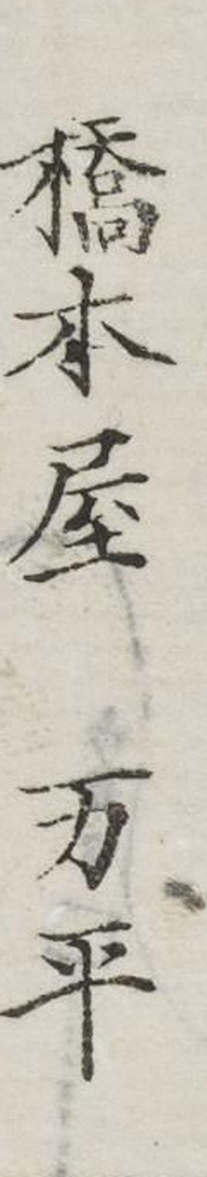橋本屋万平
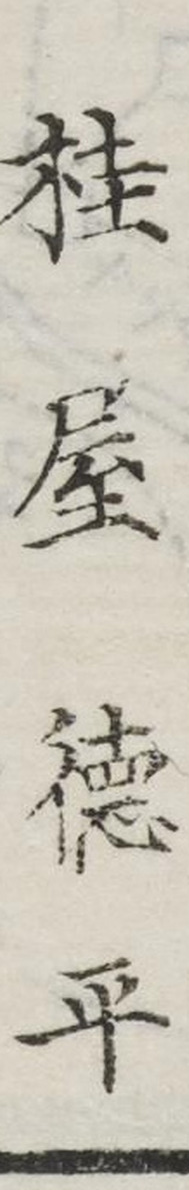桂屋徳平
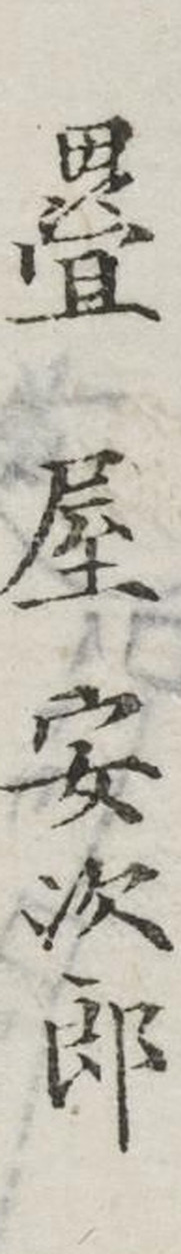畳屋安次郎
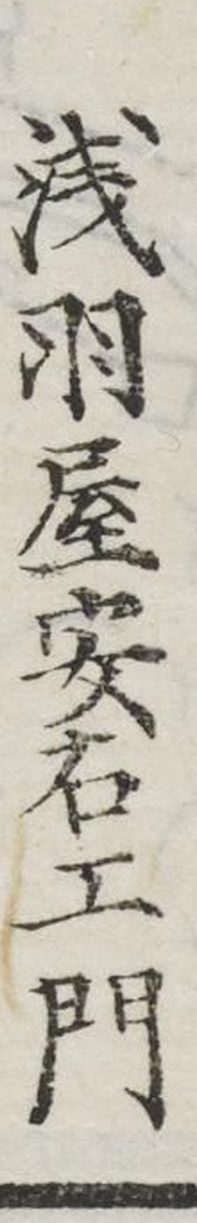浅羽屋安右エ門
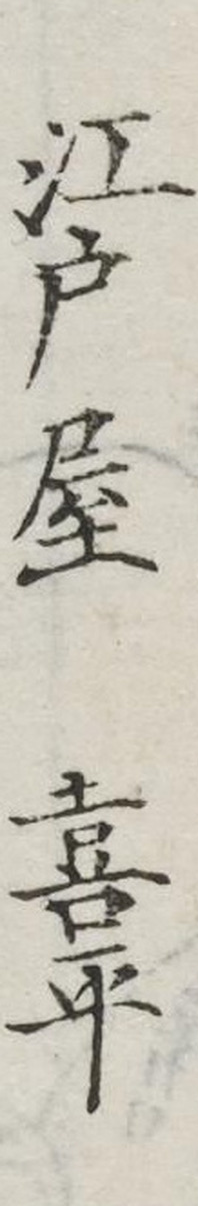江戸屋喜平
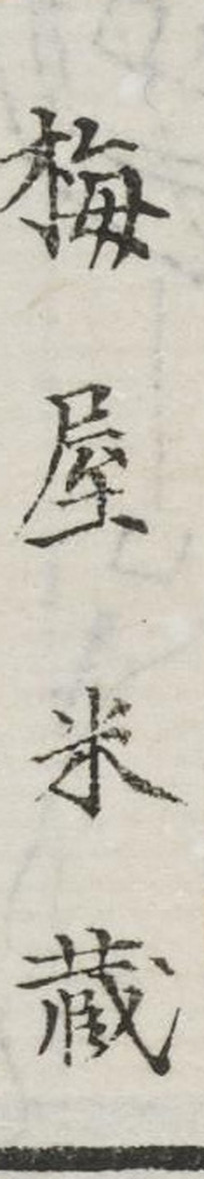梅屋米蔵
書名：伊豆国修善寺温泉名所記　全
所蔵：東京大学地震研究所図書室 Earthquake Research Institute Library, The University of Tokyo, JAPAN
